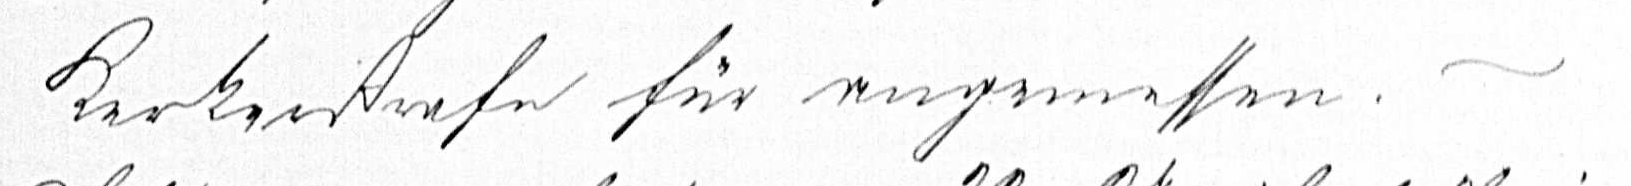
Kerkerstrafe für angemessen.
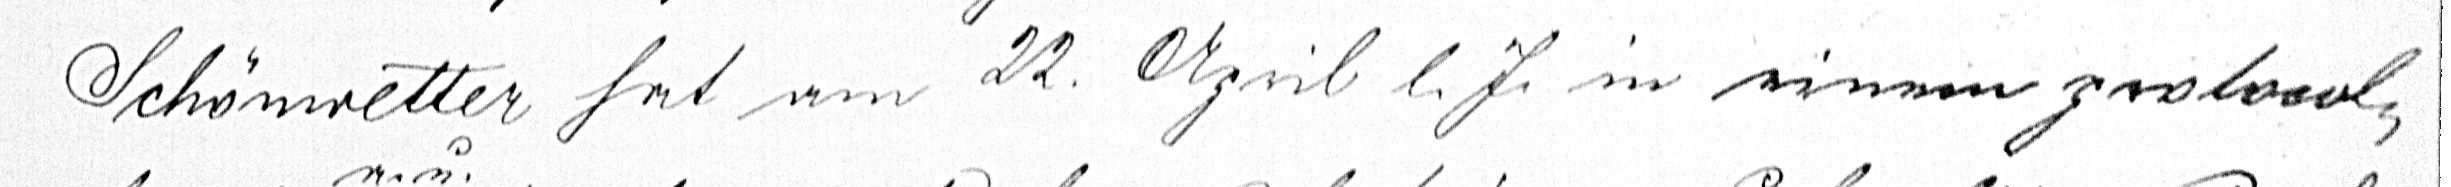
Schönwetter hat am 22. April l. J. in einem protocol¬
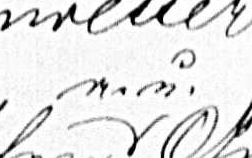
a. u.
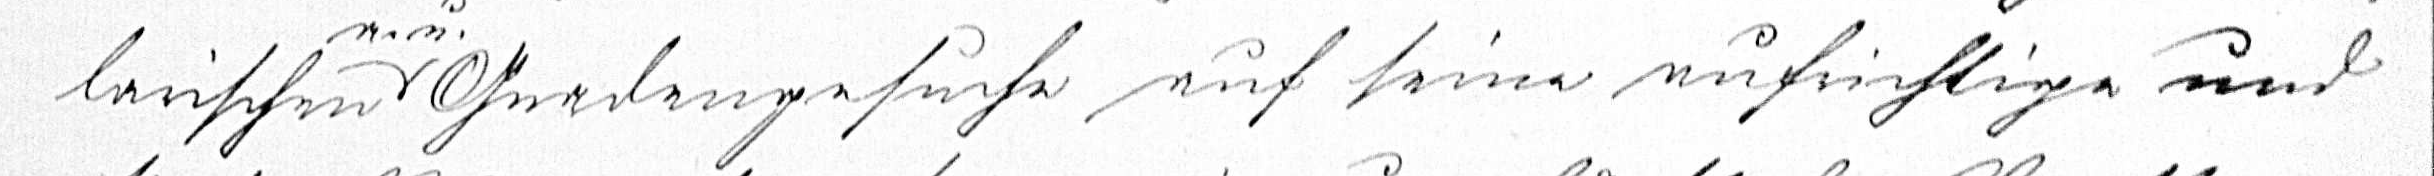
larischen Gnadengesuch auf seine aufrichte und
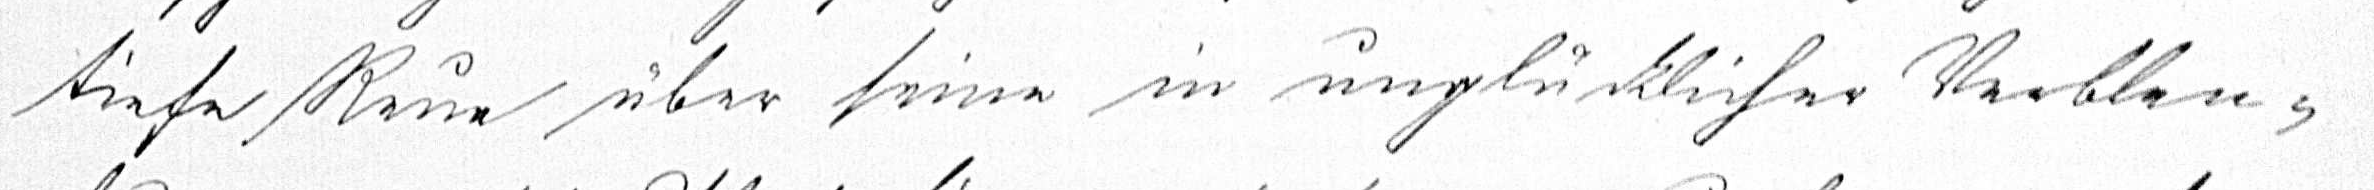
tiefe Reue über seine in unglücklicher Verblen¬
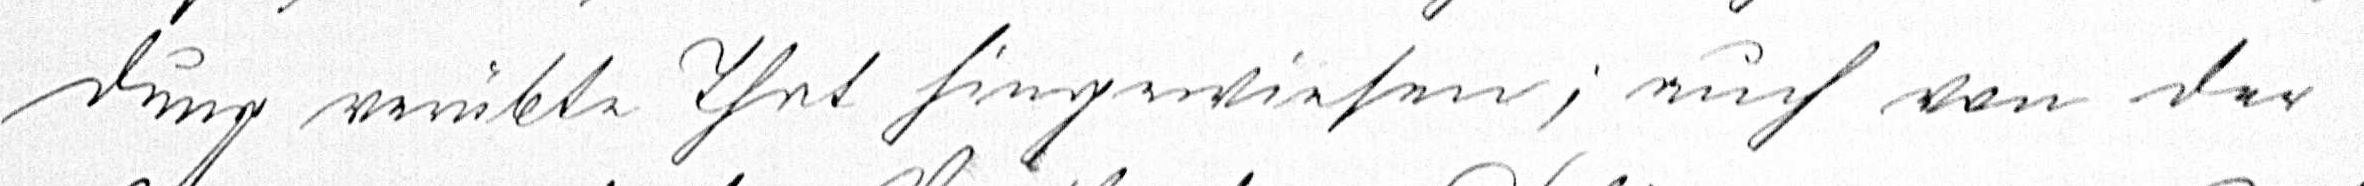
dung verübte That hingewiesen, auch von der
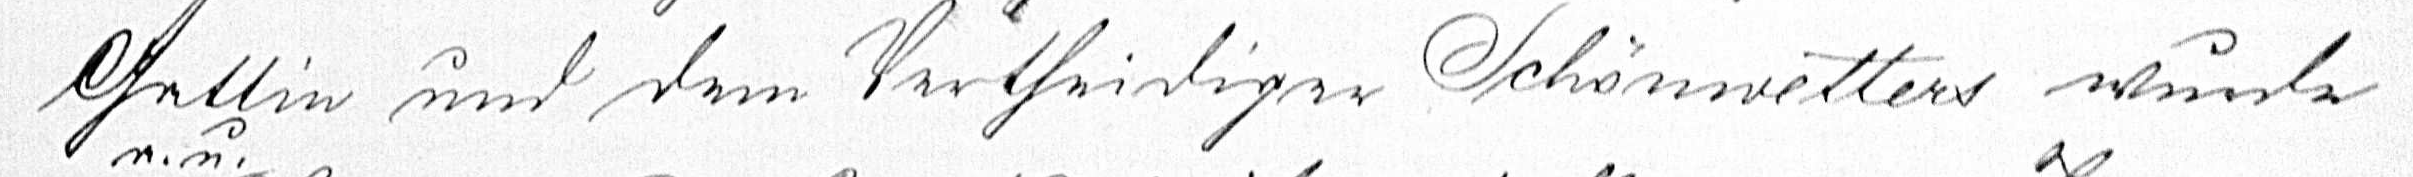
Gattin und dem Vertheidiger Schönwetters wurde
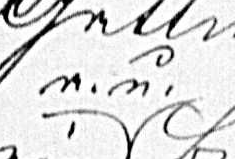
a.u.
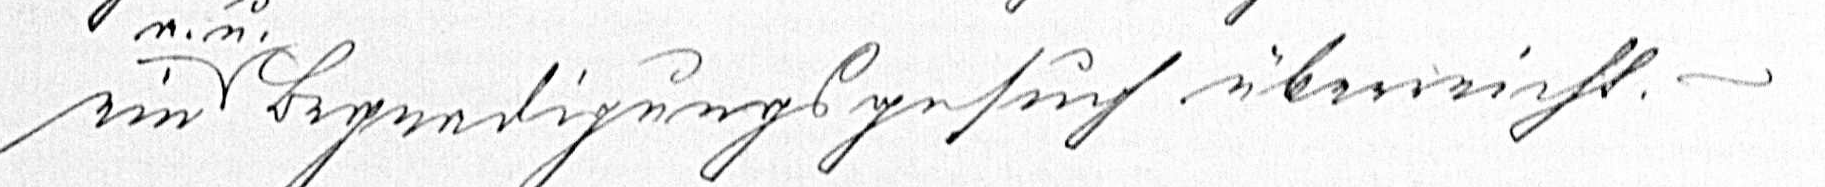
ein Begnadigungsgesuch überreicht.
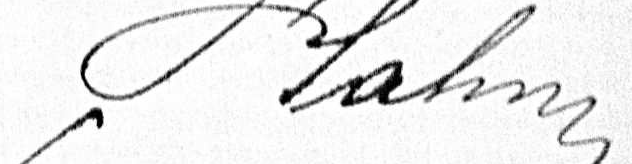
Hahn
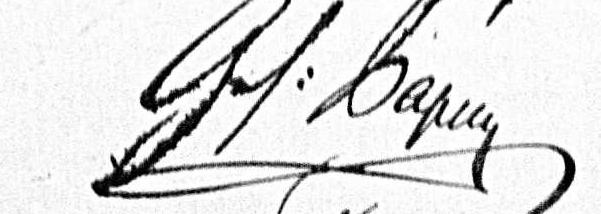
Ges. Basny
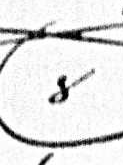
8
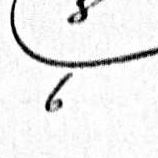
6
